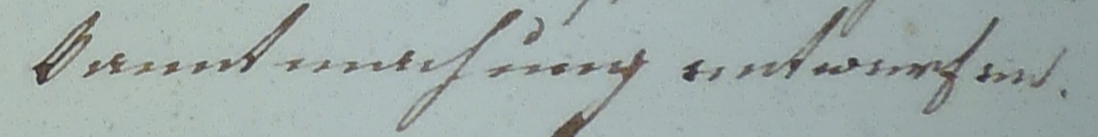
kanntmachung entwerfen.
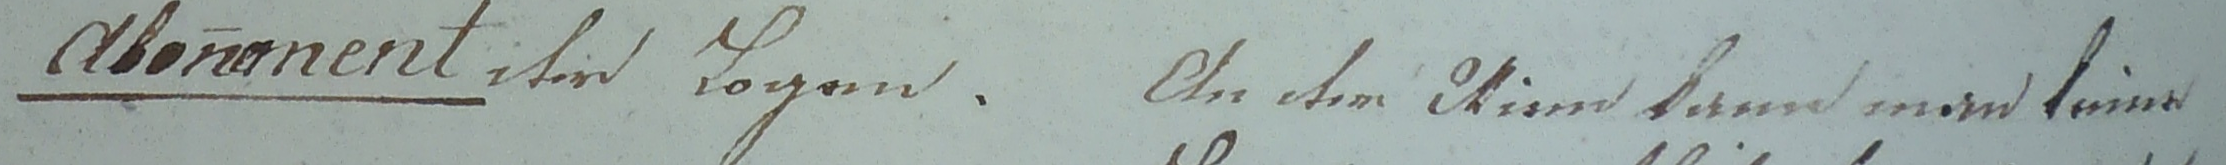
Abon̅ement der Logen . An der Wien kann man keine
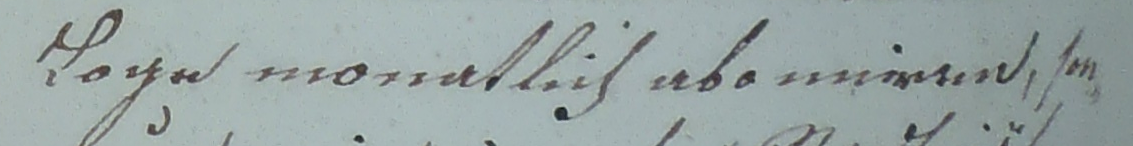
Loge monatlich abonniren, sie
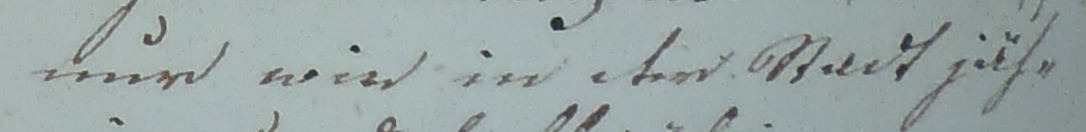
nur wie in der Stadt jäh¬
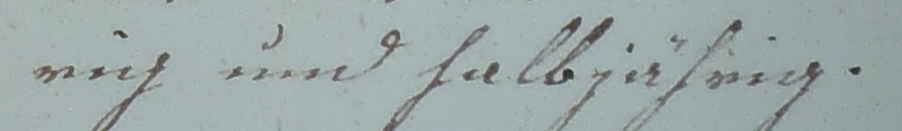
rig und halbjährig.
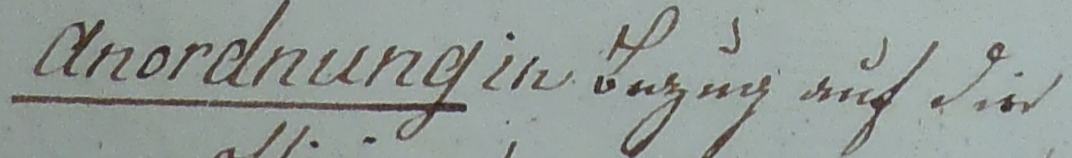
Anordnung in Bezug auf die
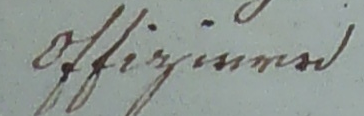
Offiziere
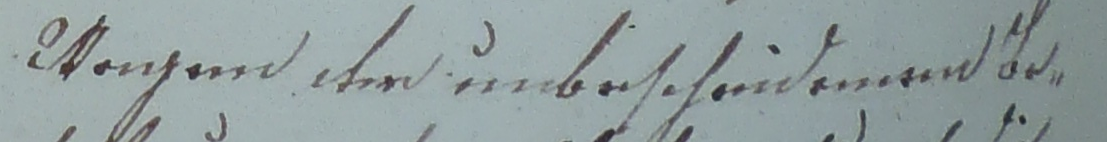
Wegen der unbeschiedenen Be¬
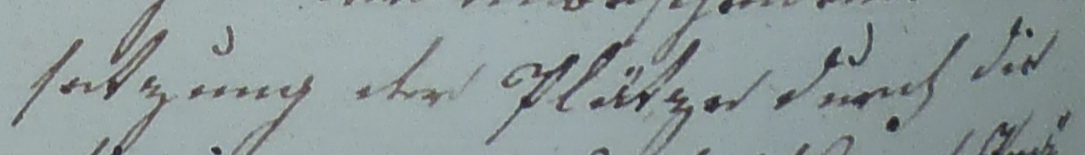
setzung der Plätze durch die
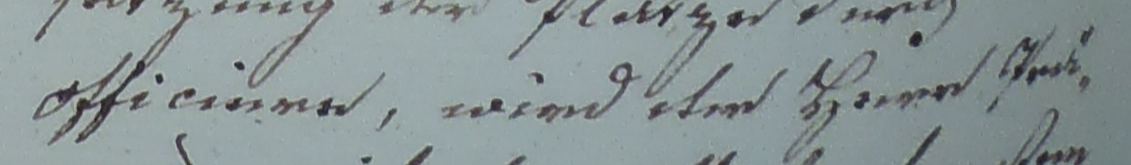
Offiziere, wird der Herr Prä¬
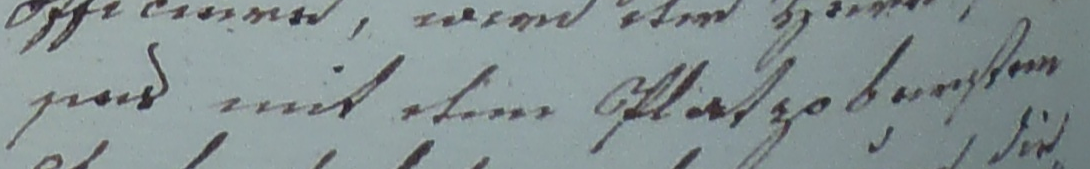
ses mit dem Platzobersten
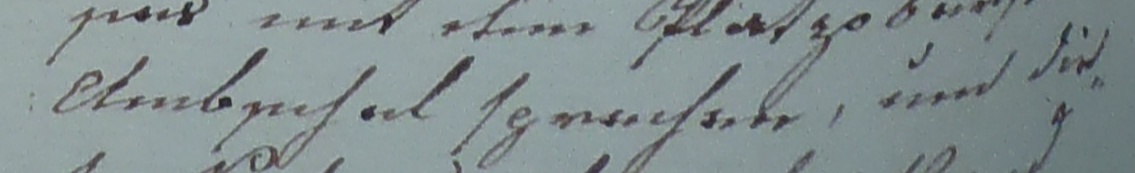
Ambschel sprechen, und die¬
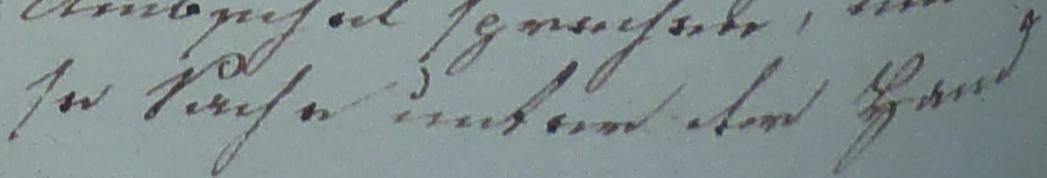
se Sache unter der Hand
